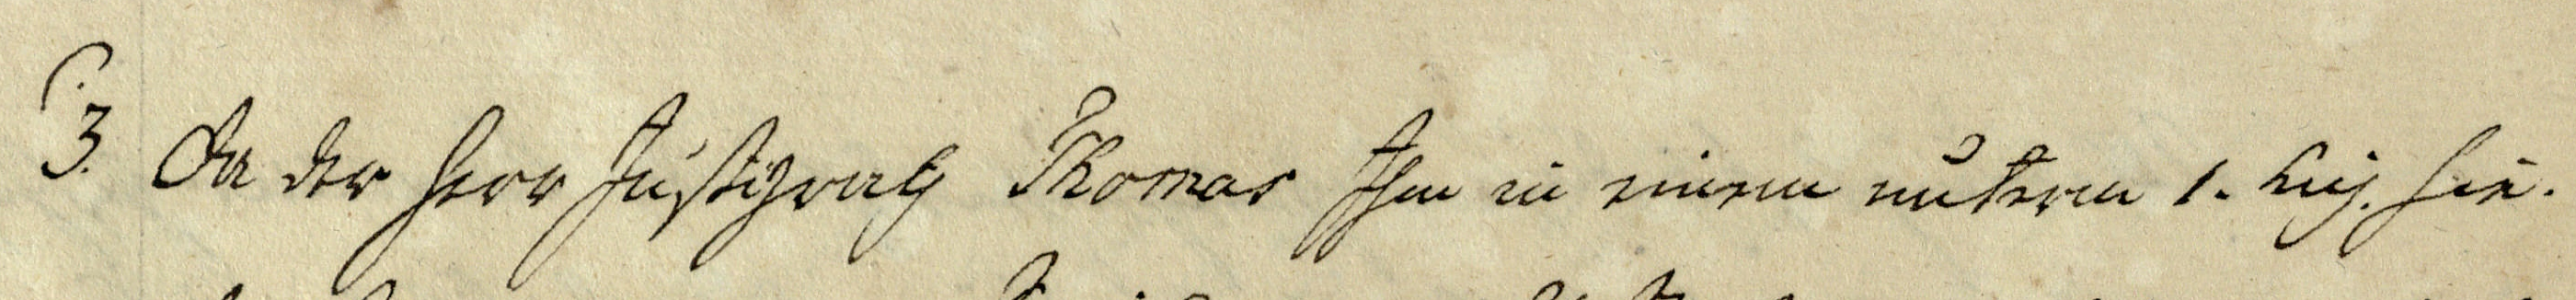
3. Da der Herr Justizrath Thomas Ihm in einem unterm 1. huj. hie¬
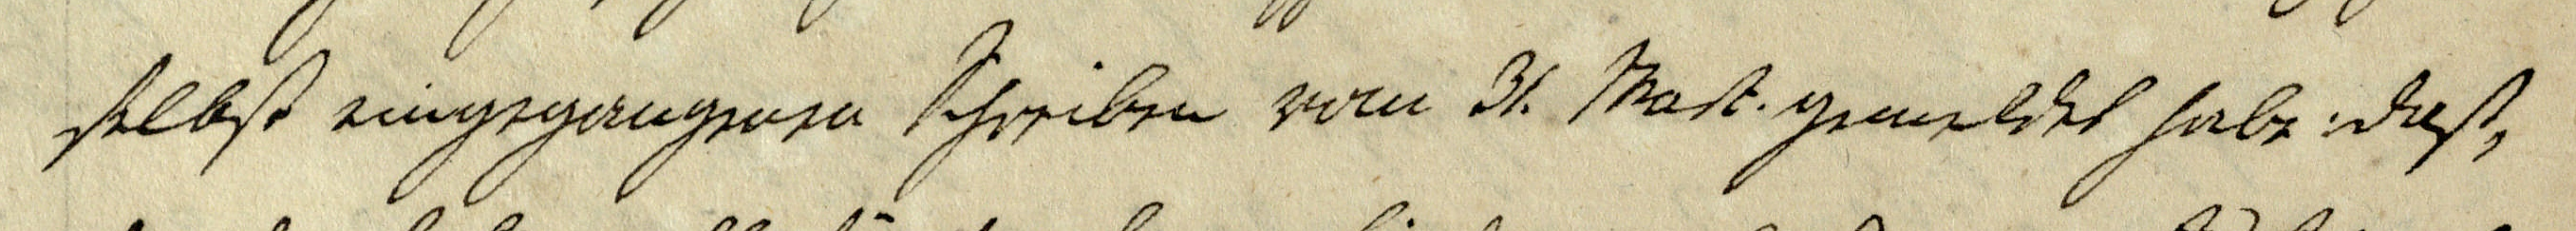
selbst eingegangenen Schreiben vom 31. Mart. gemeldet habe daß,
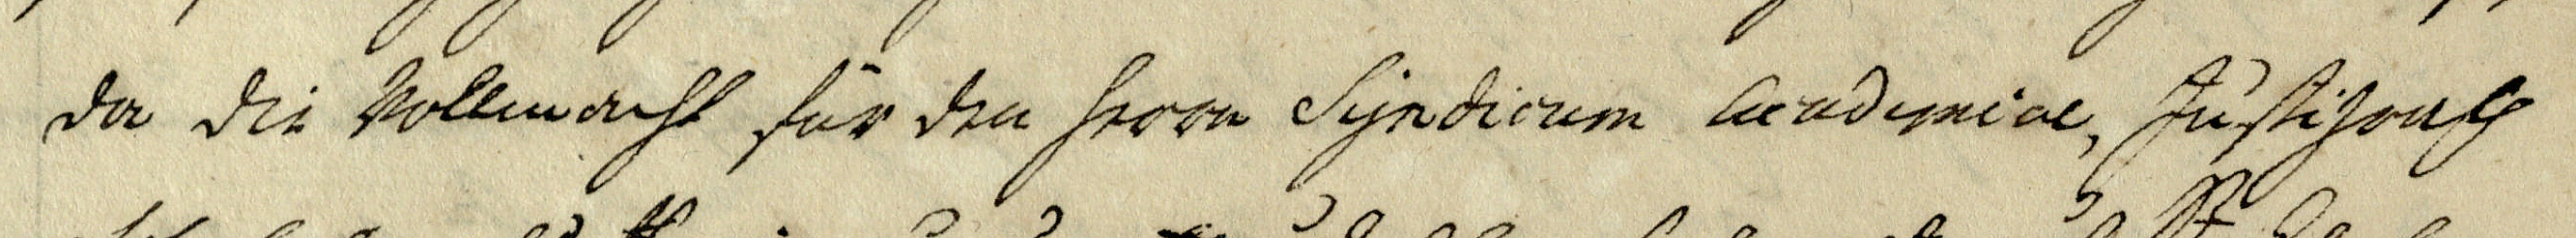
da die Vollmacht für den Herrn Sÿndicum Academiae, Justizrath
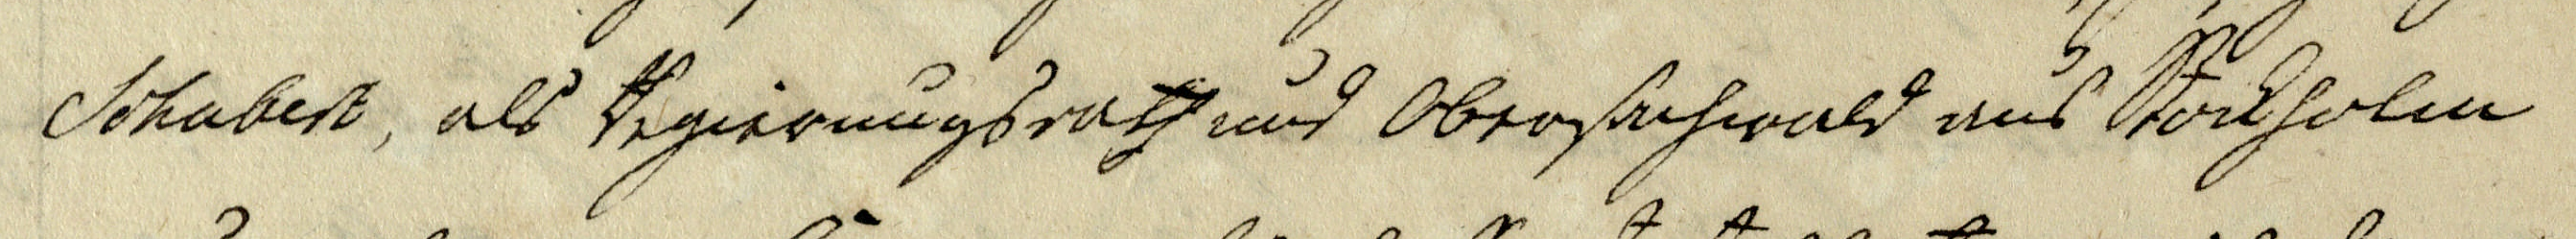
Schubert, als Regierungsrath und Obersachwald aus Stockholm
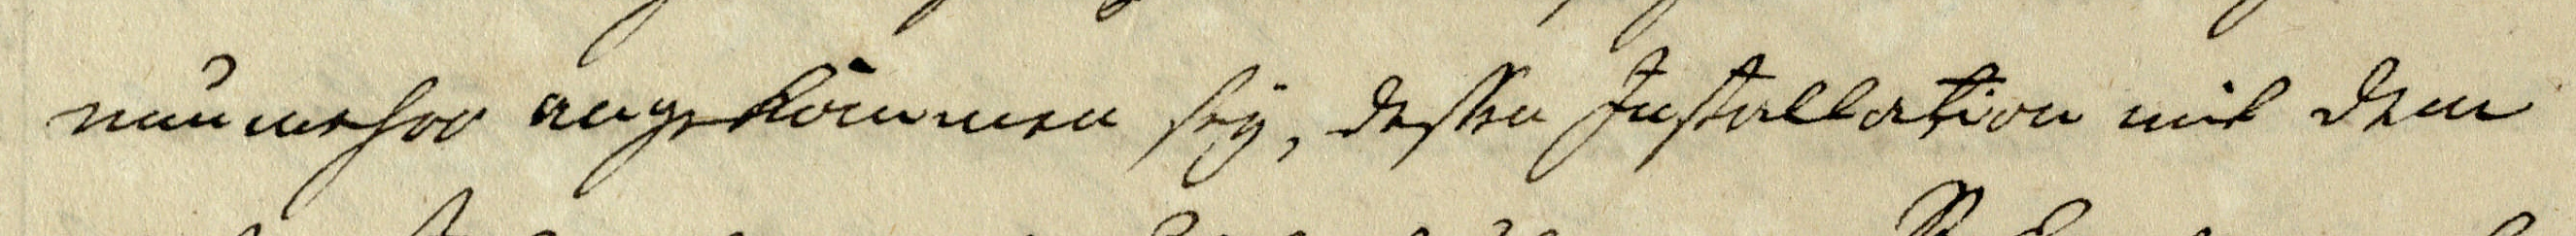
nunmehro angekommen seÿ, dessen Installation mit dem
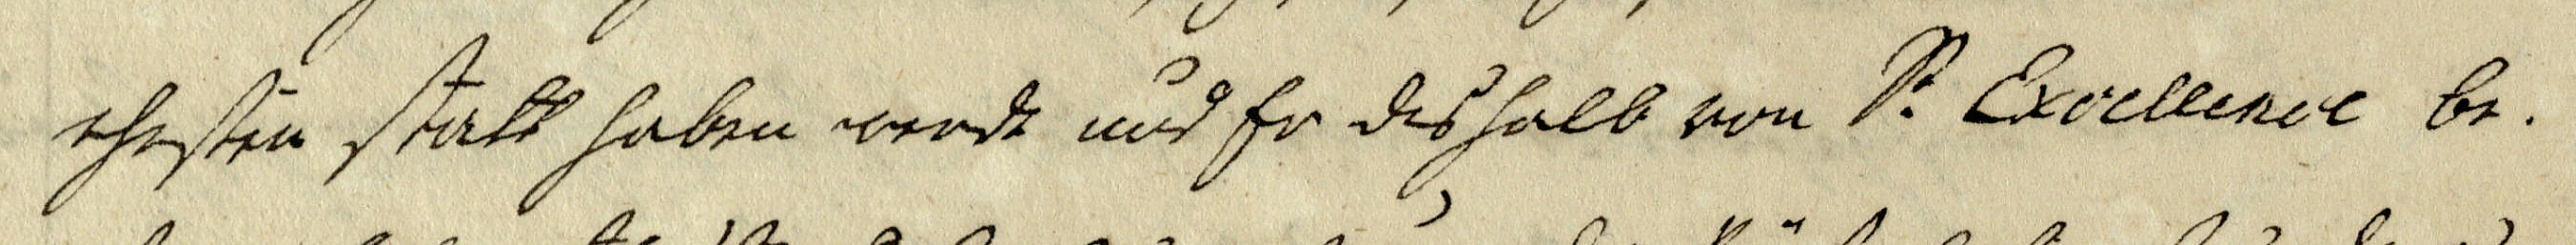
ehesten statt haben werde und Er deshalb von Sr. Excellence be.
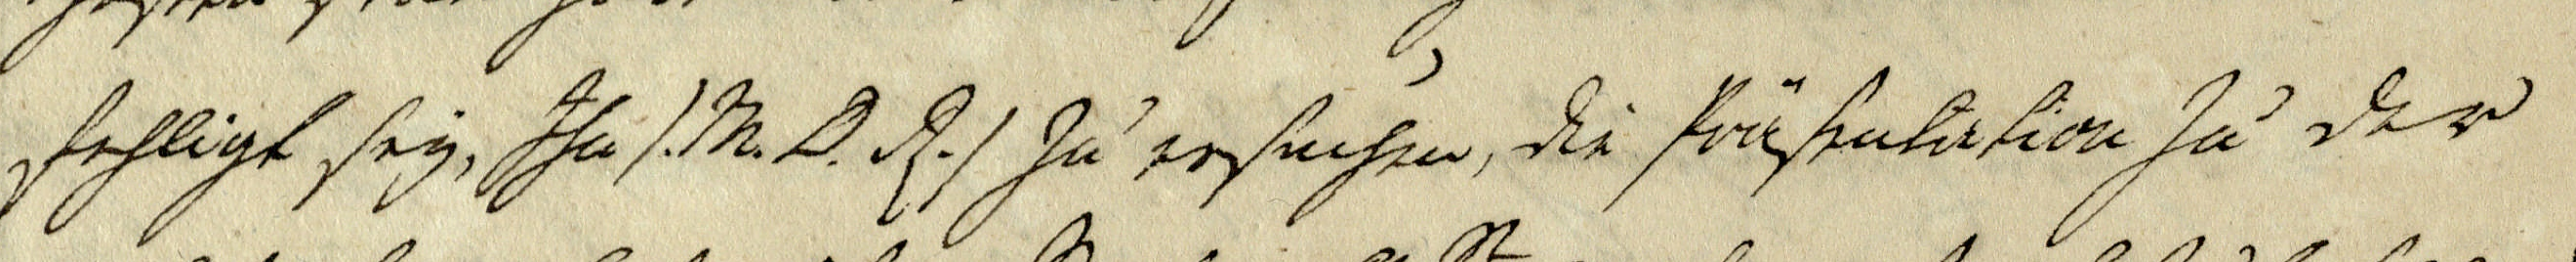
fehligt seÿ, Ihn /.M. D. R./ zu ersuchen, die Präsentation zu der
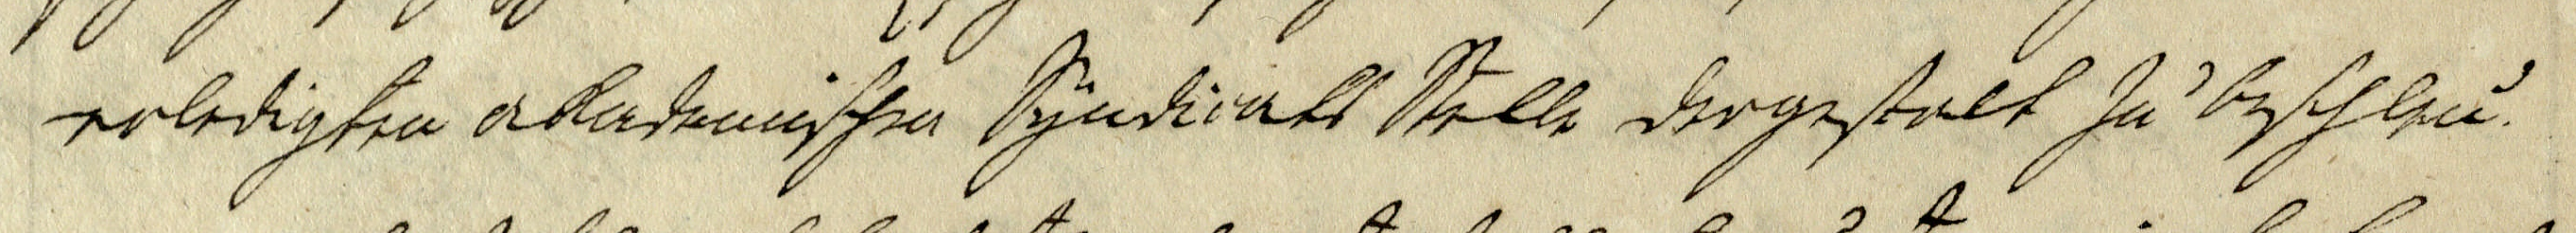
erledigten akademischen Sÿndicats Stelle dergestalt zu beschleu¬
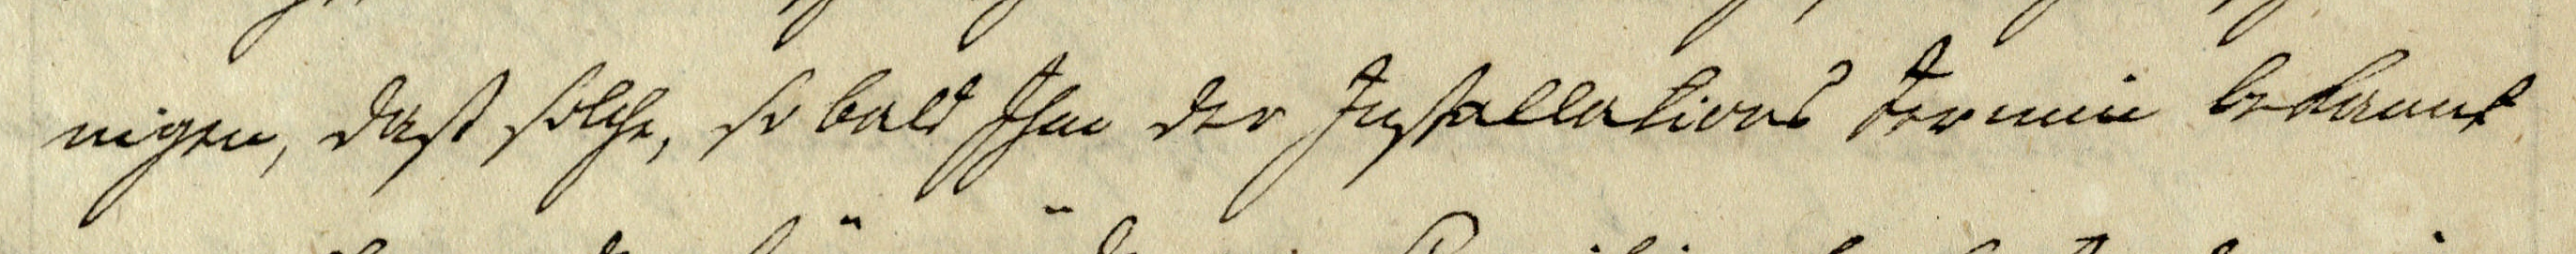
nigen, daß solche, so bald Ihm der Installations Termin bekannt
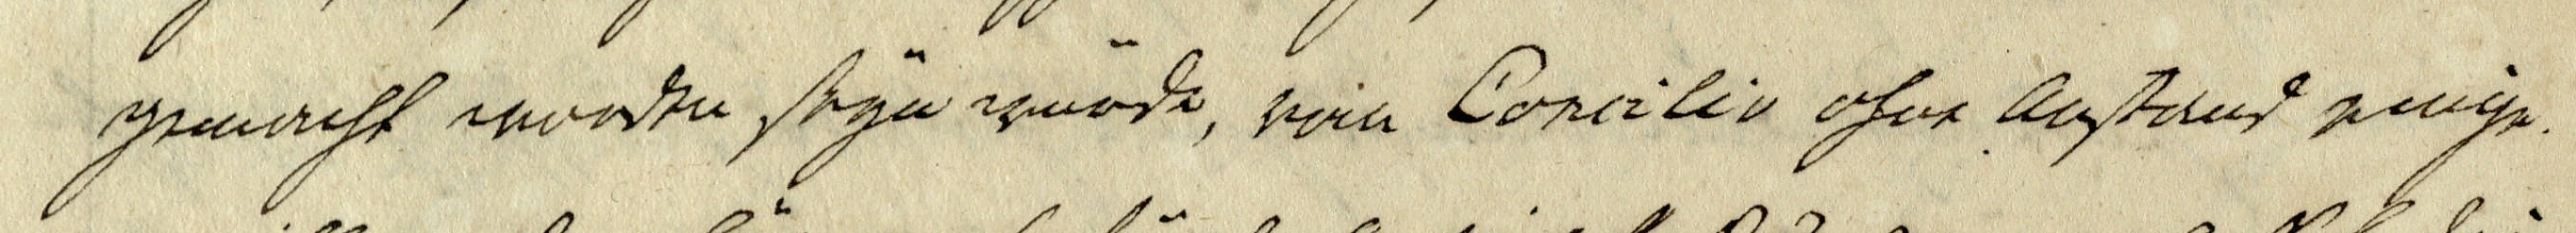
gemacht worden seÿn würde, vom Concilio ohne Anstand einge¬
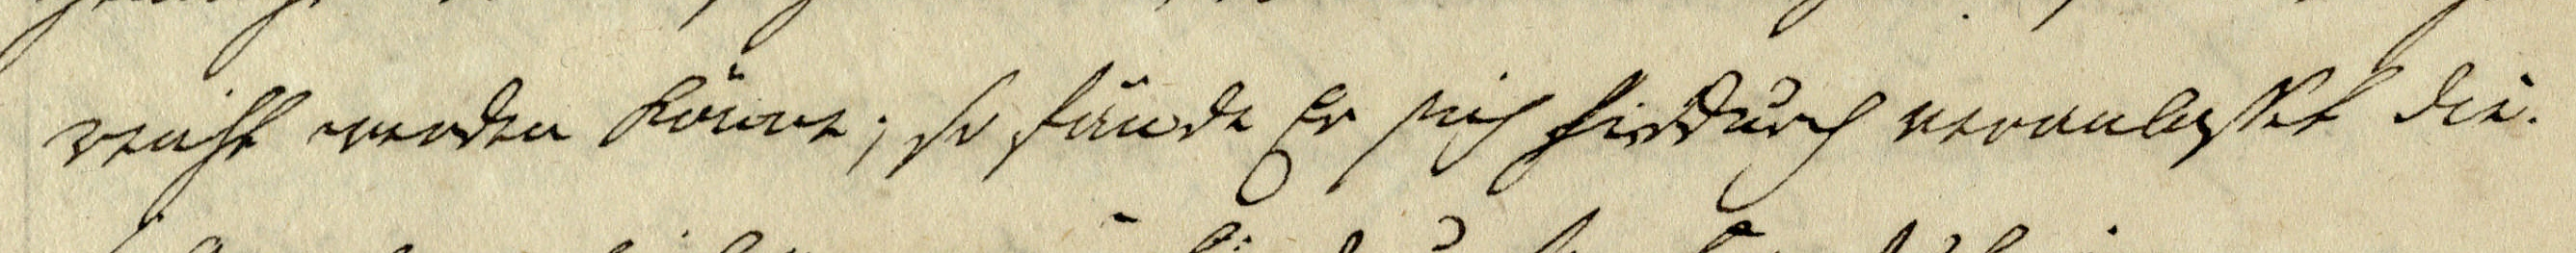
reicht werden könne; so fände Er sich hiedurch veranlasset die¬
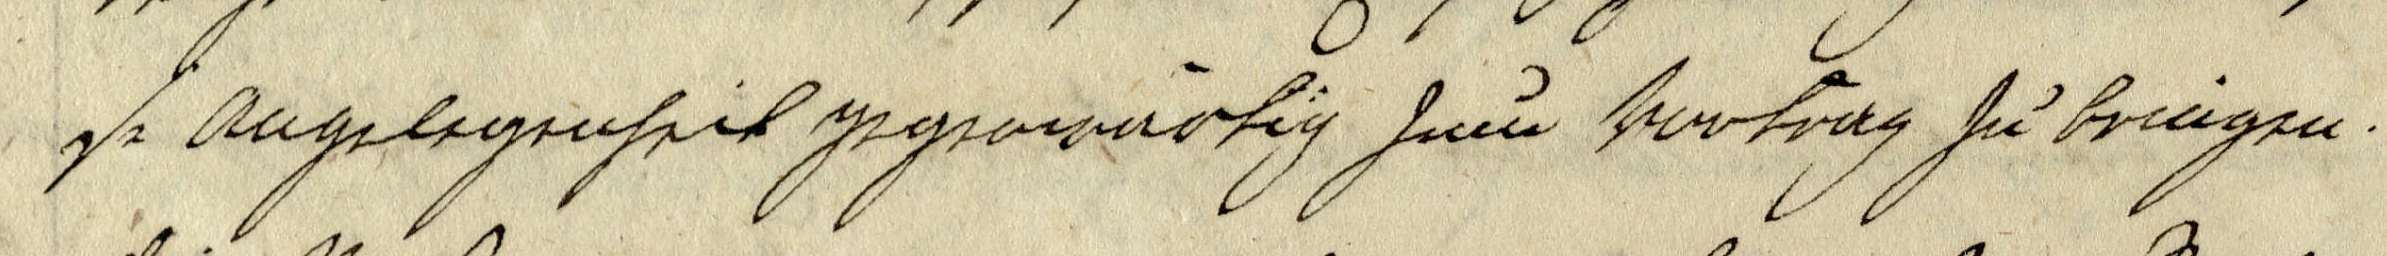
se Angelegenheit gegenwärtig zum Vortrag zu bringen.
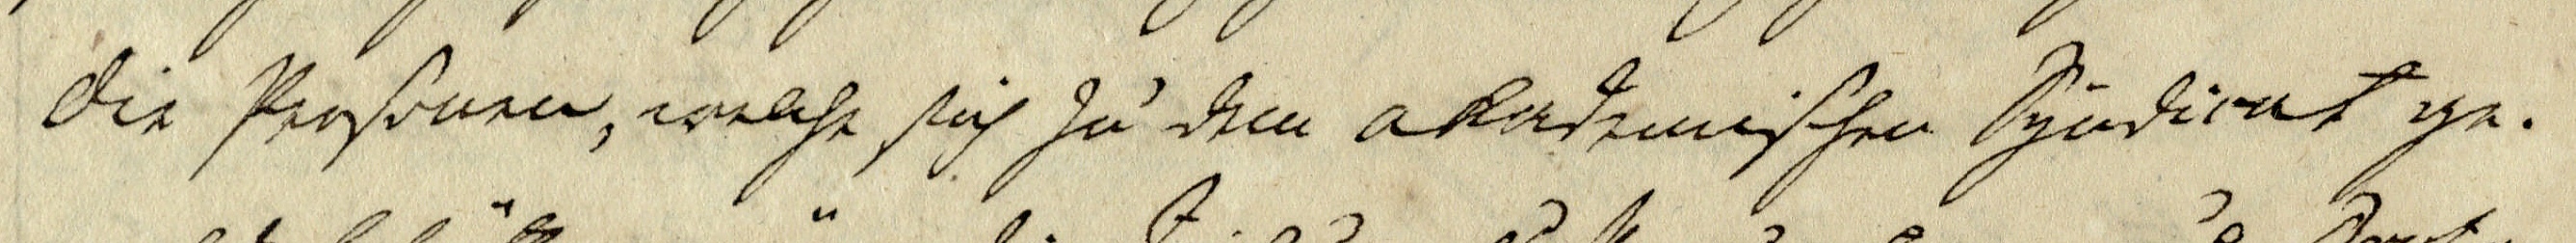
Die Personen, welche sich zu dem akademischen Sÿndicat ge¬
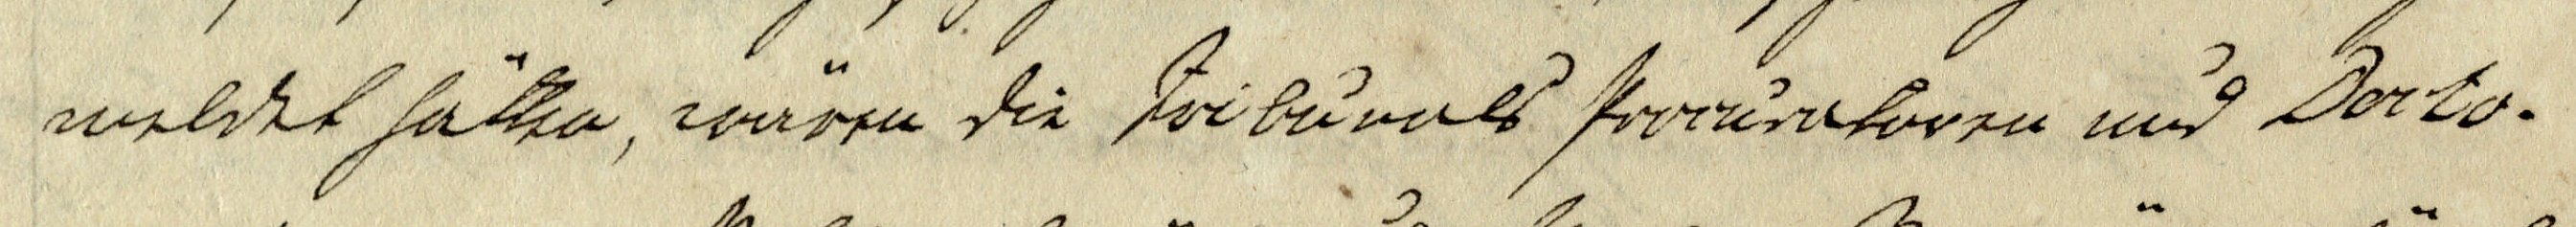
meldet hätten, wären die Tribunals Procuratoren und Docto¬
